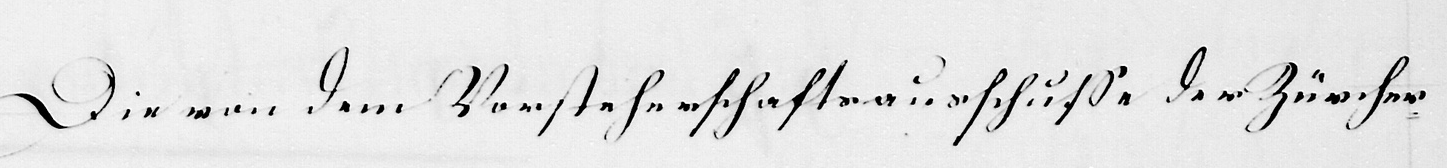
Die von dem Vorsteherschaftsausschuße der Zürcher¬
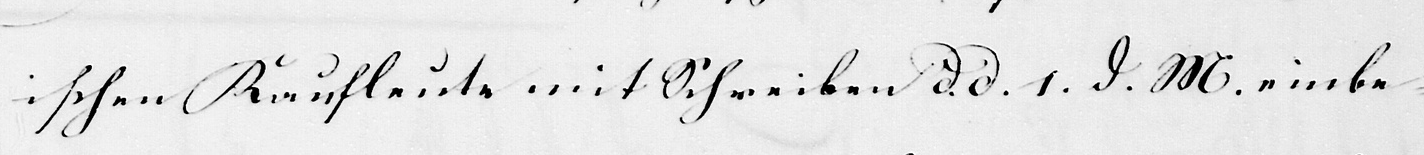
ischen Kaufleute mit Schreiben d. d. 1. d. M. einbe¬
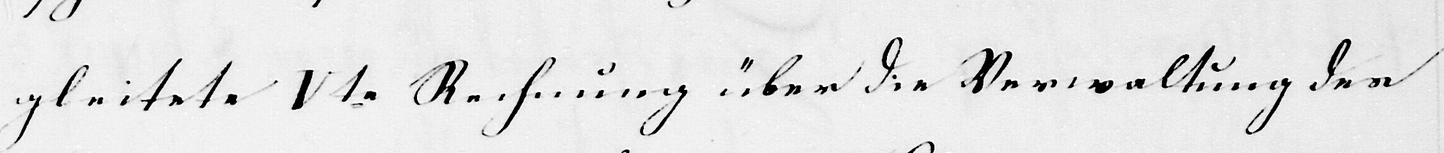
gleitete Vte Rechnung über die Verwaltung des
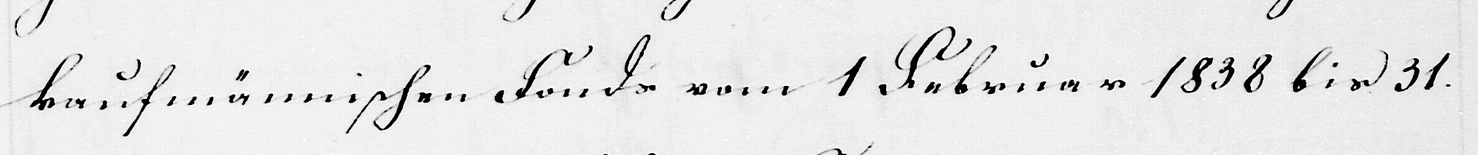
kaufmännischen Fonds vom 1 Februar 1838 bis 31.
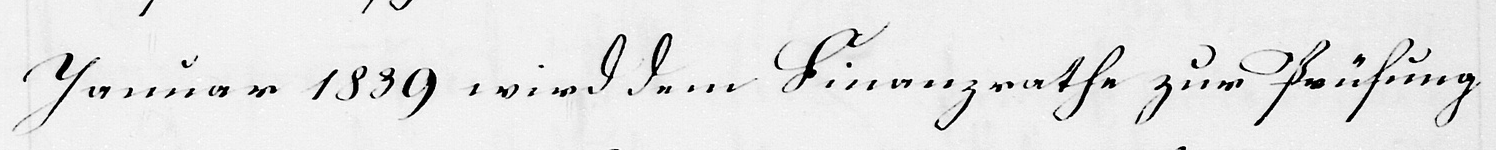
Januar 1839 wird dem Finanzrathe zur Prüfung
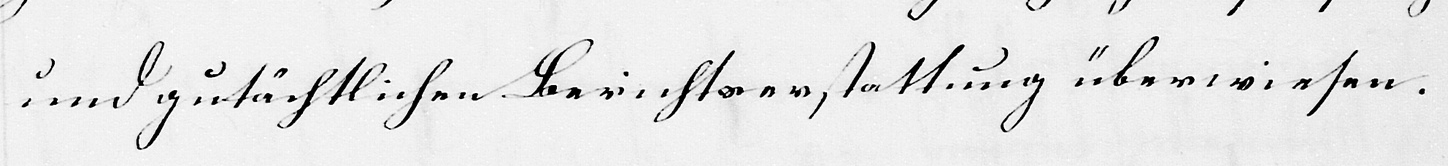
und gutächtlichen Berichtserstattung überwiesen.
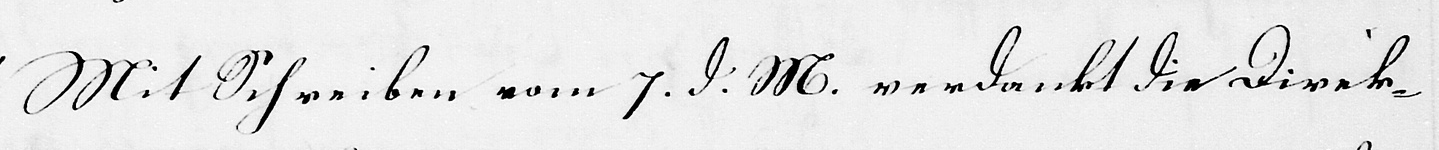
Mit Schreiben vom 7. d. M. verdankt die Direk¬
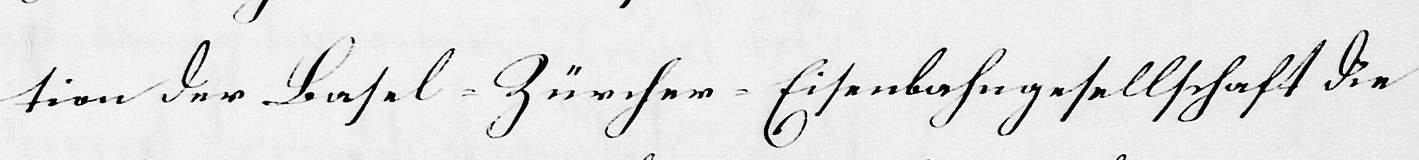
tion der Basel-Zürcher-Eisenbahngesellschaft die
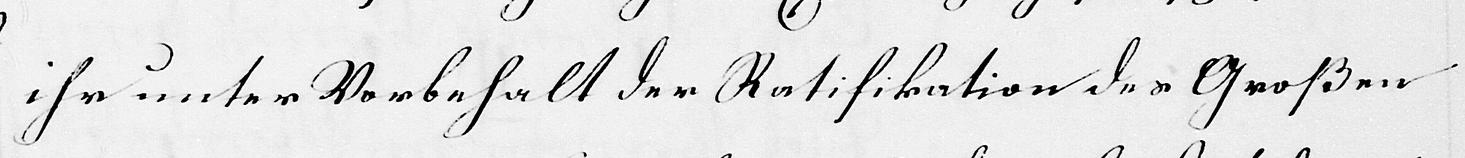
ihr unter Vorbehalt der Ratifikation des Großen
